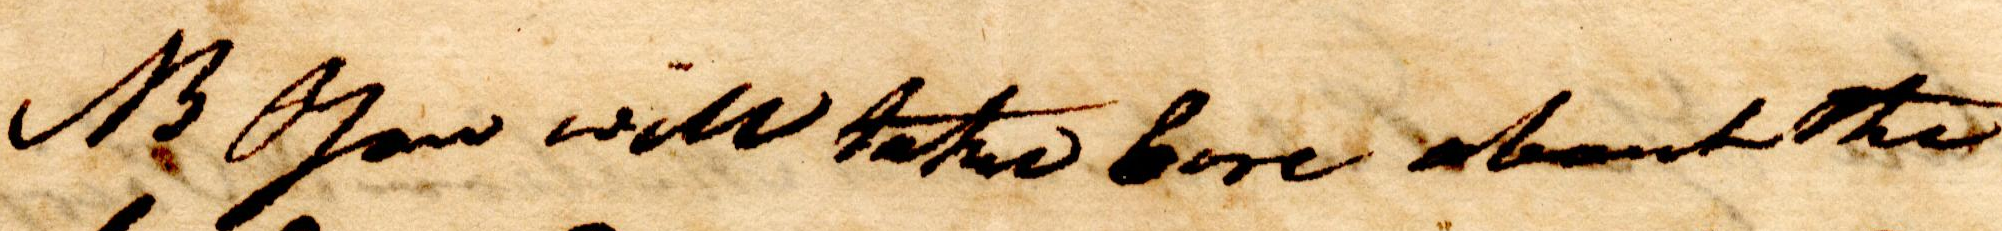NB you will take Care about the
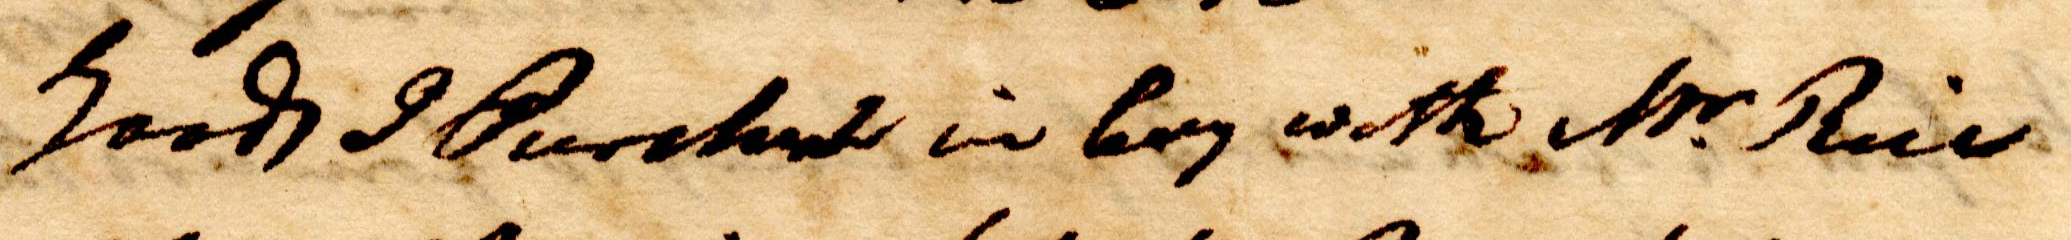Goods I purchase in care with M^r. Rice
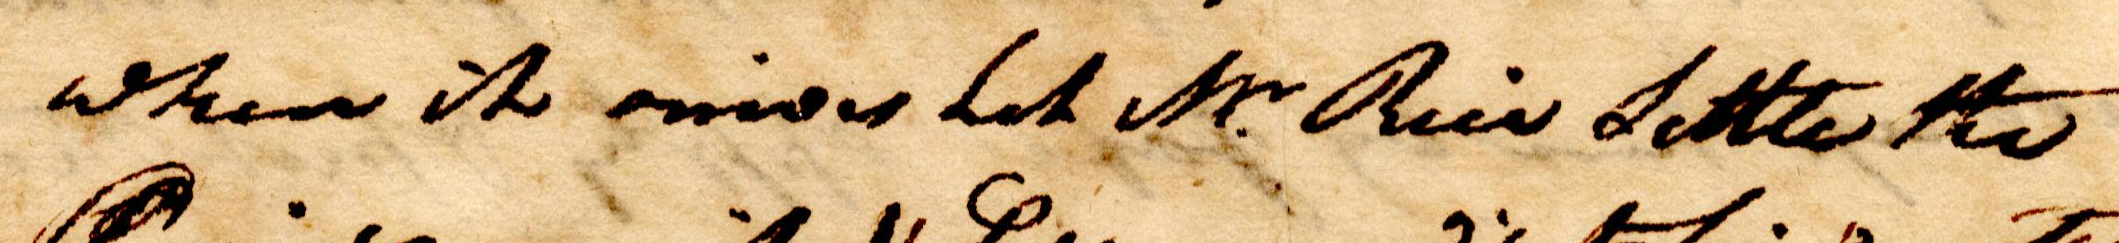when it arises Let M^r Rice Settle the
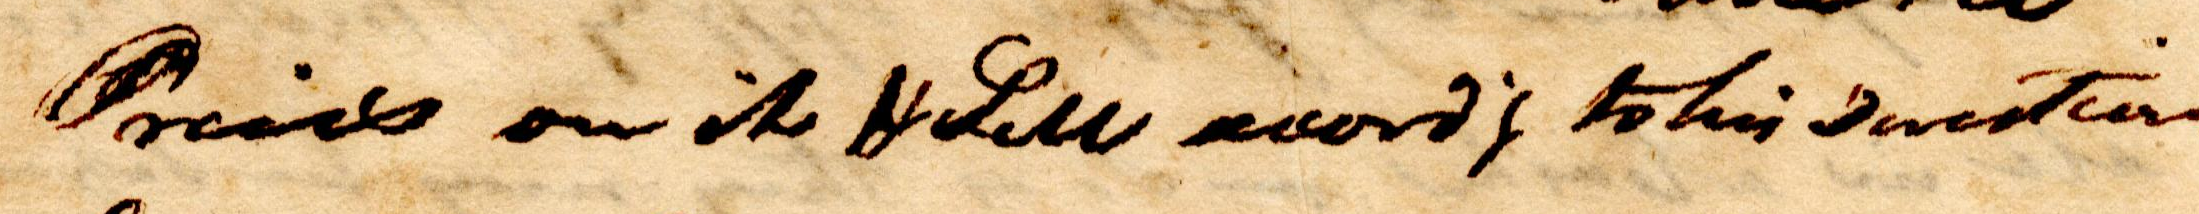Prices on it & sell accord^g to his Direction
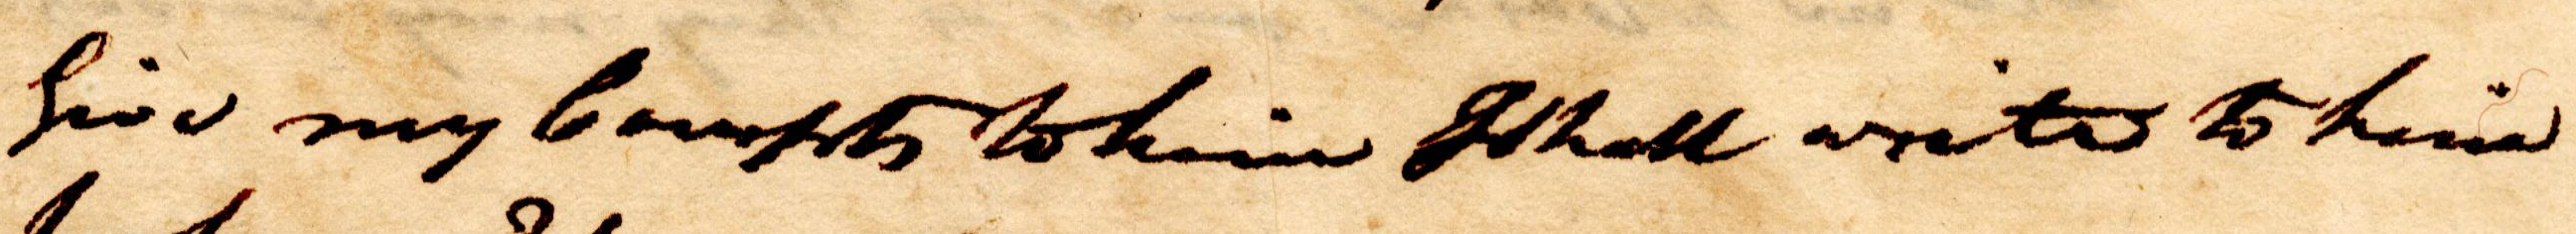give my compt^s to him I shall write to him
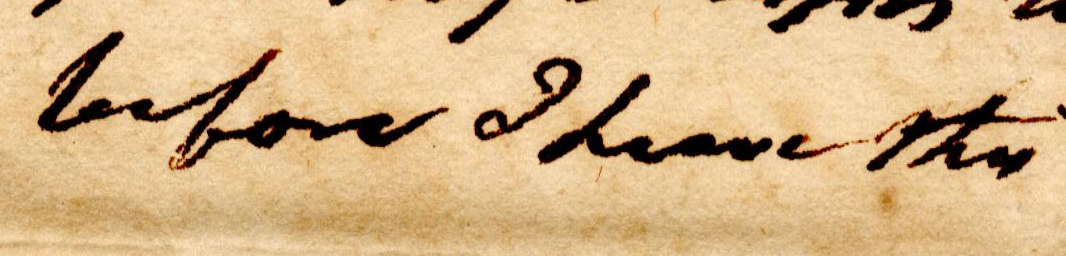before I leave this
